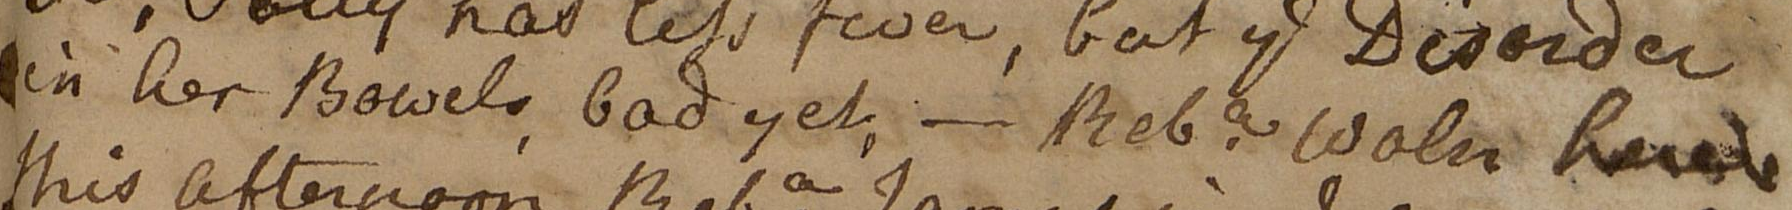in her Bowels bad yet,- Reb^a. Woln here
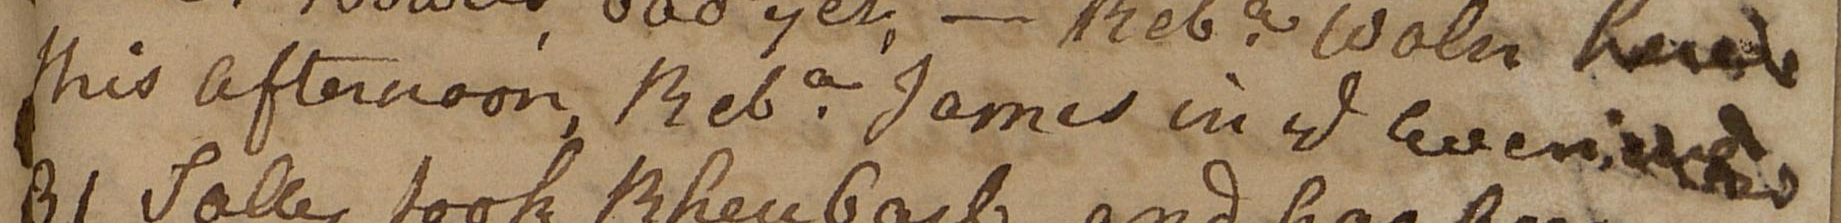this afternoon, Reb^a. James in y^e Evening
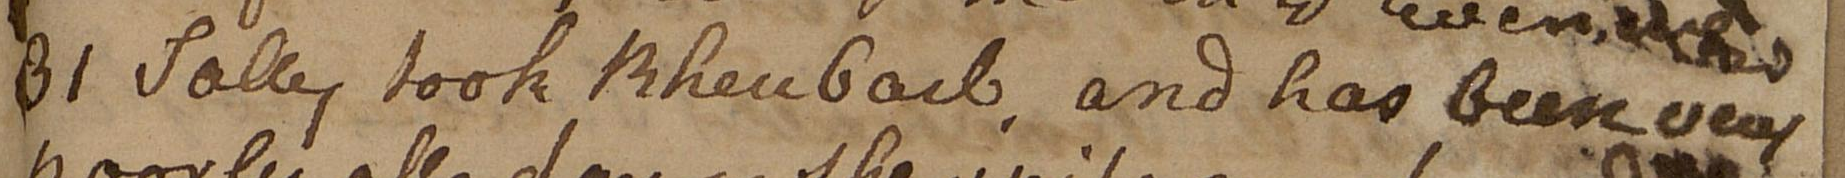31 Sally took Rheubarb, and has been very
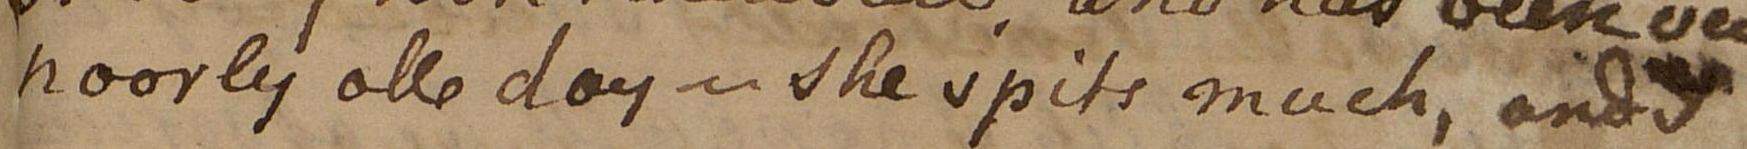poorly all day- she spits much, and I
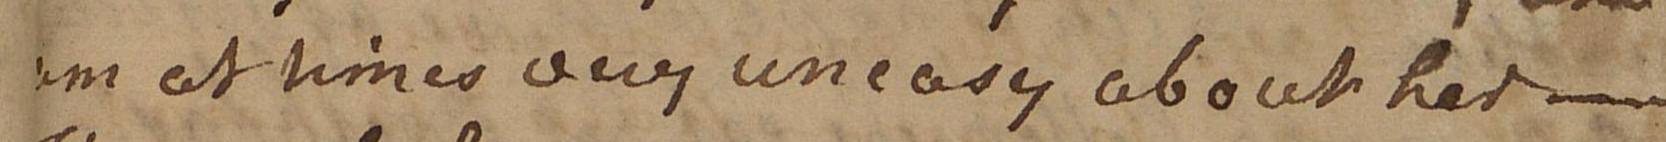am at times very uneasy about her-
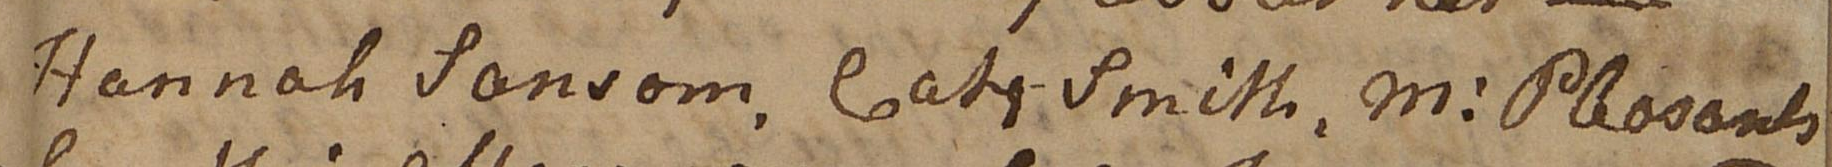Hannah Sansom, Caty Smith, M: Pleasants
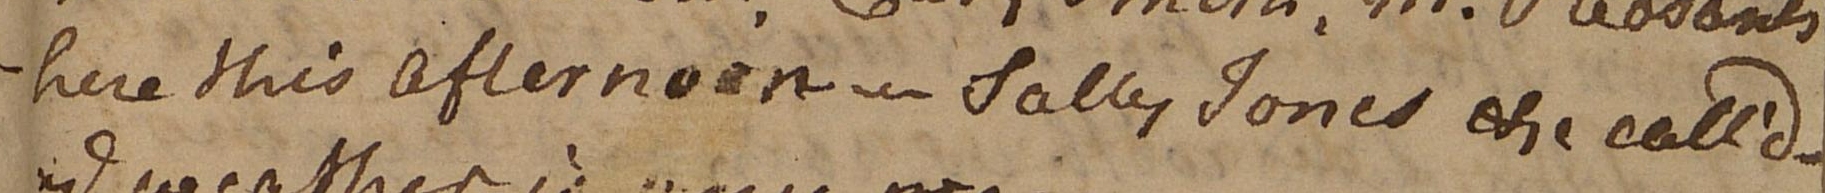here this afternoon- Sally Jones &c call'd
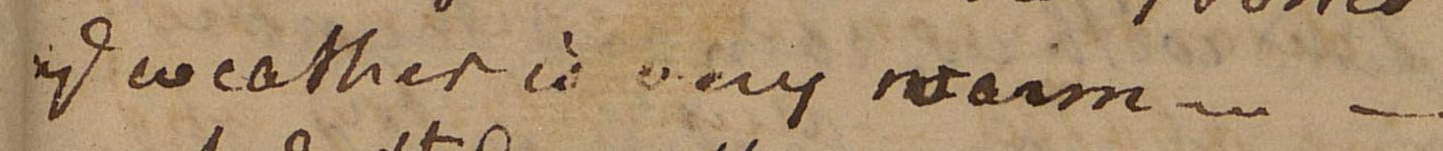y^e weather is very warm- -
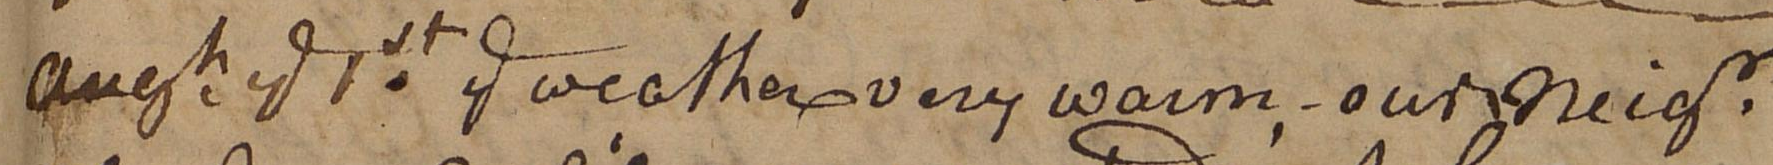Aug.^t y^e 1.^st weather very warm,- our neig.^r
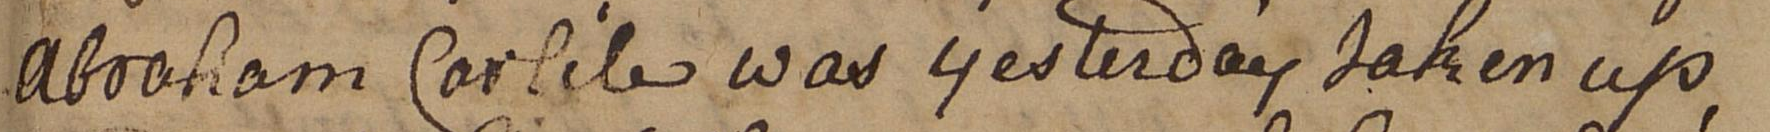Abraham Carlile was yesterday taken up,
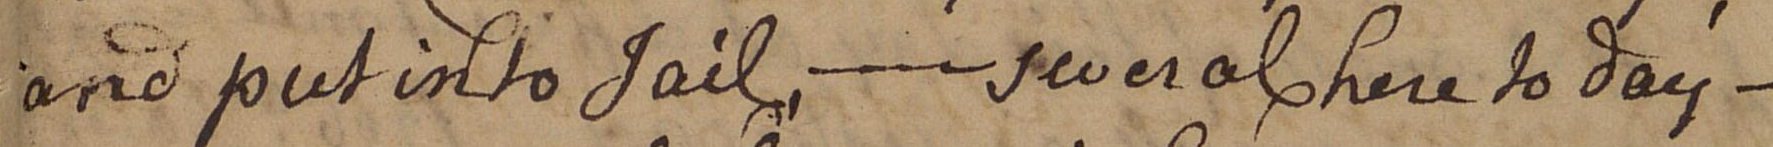and put into Jail;- several here to day-
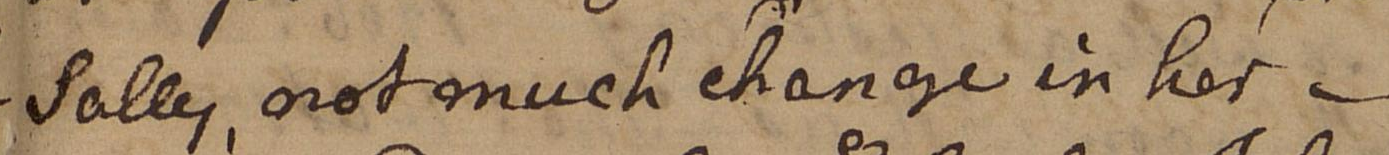Sally, not much change in her-
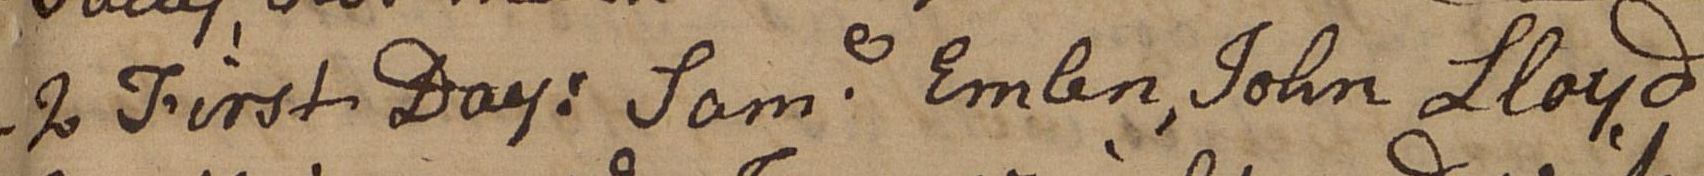2 First Day: Sam^l Emlen, John Lloyd
